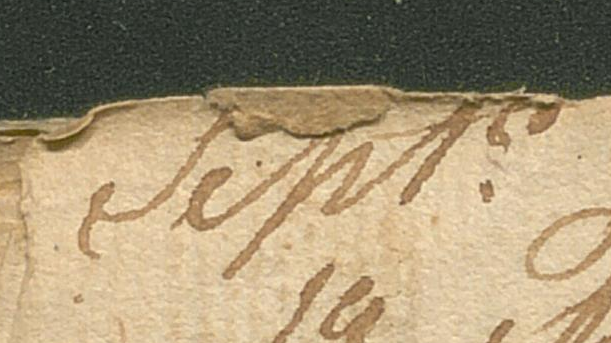Sept^r.
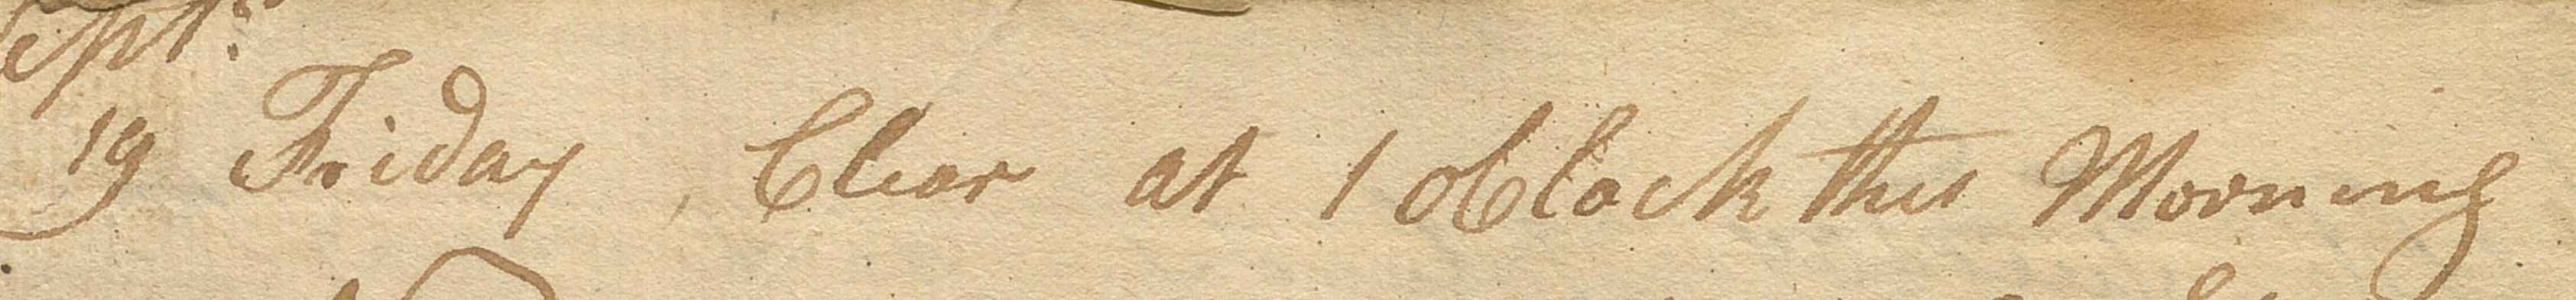19 Friday, Clear at 1 oClock this Morning
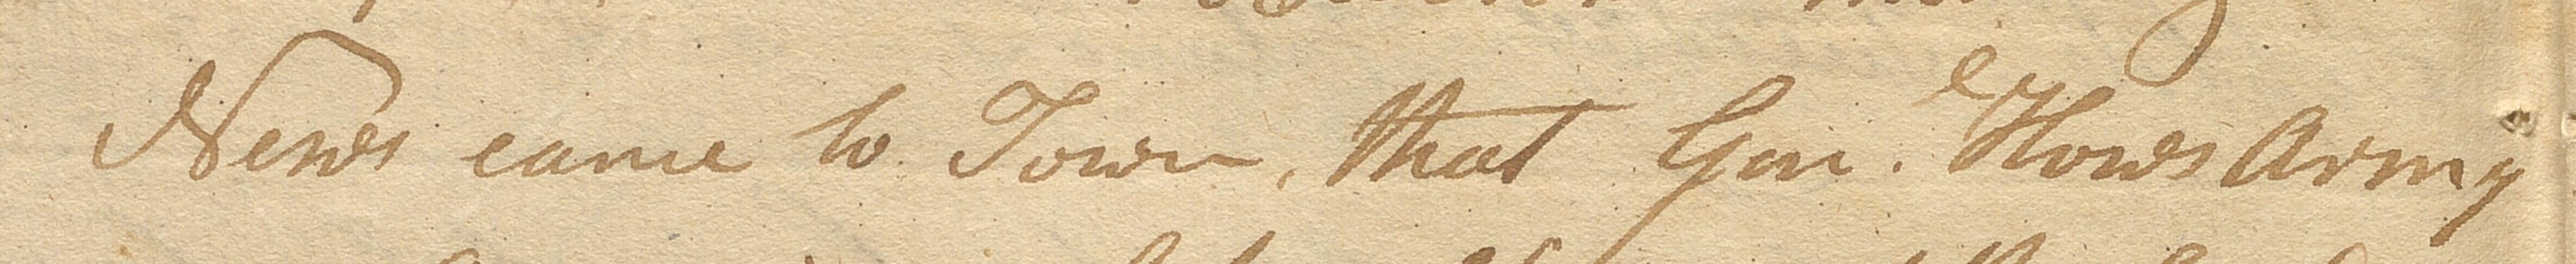News came to Town that Gen^l. Hows Army
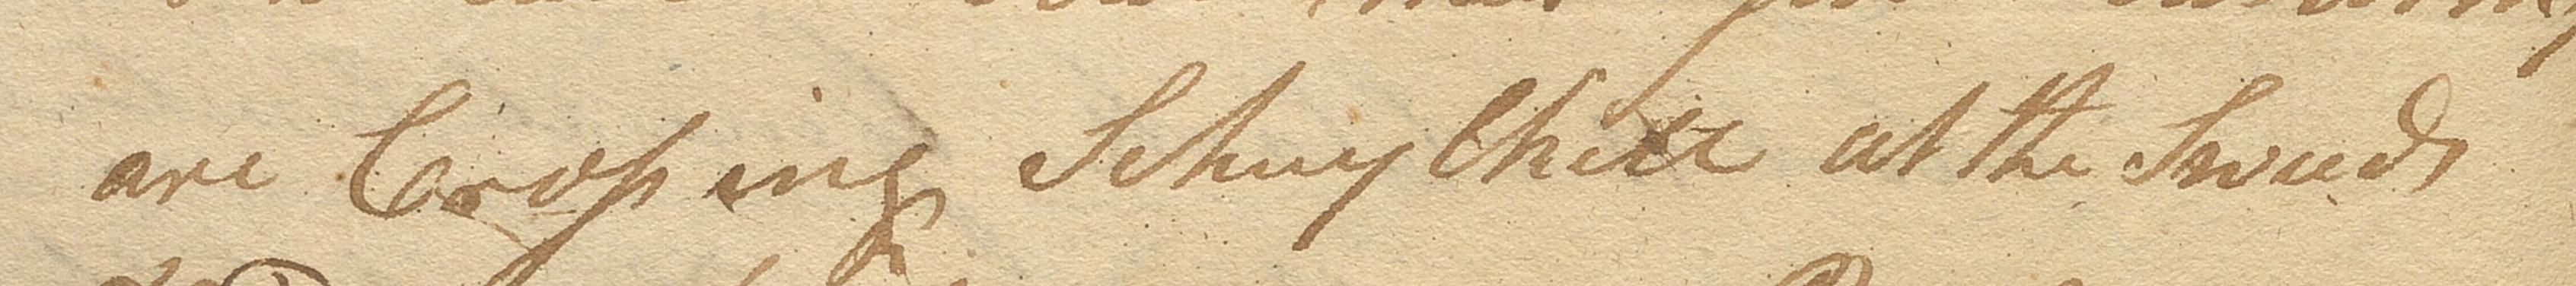are Crossing Schuylkill at the Sweeds
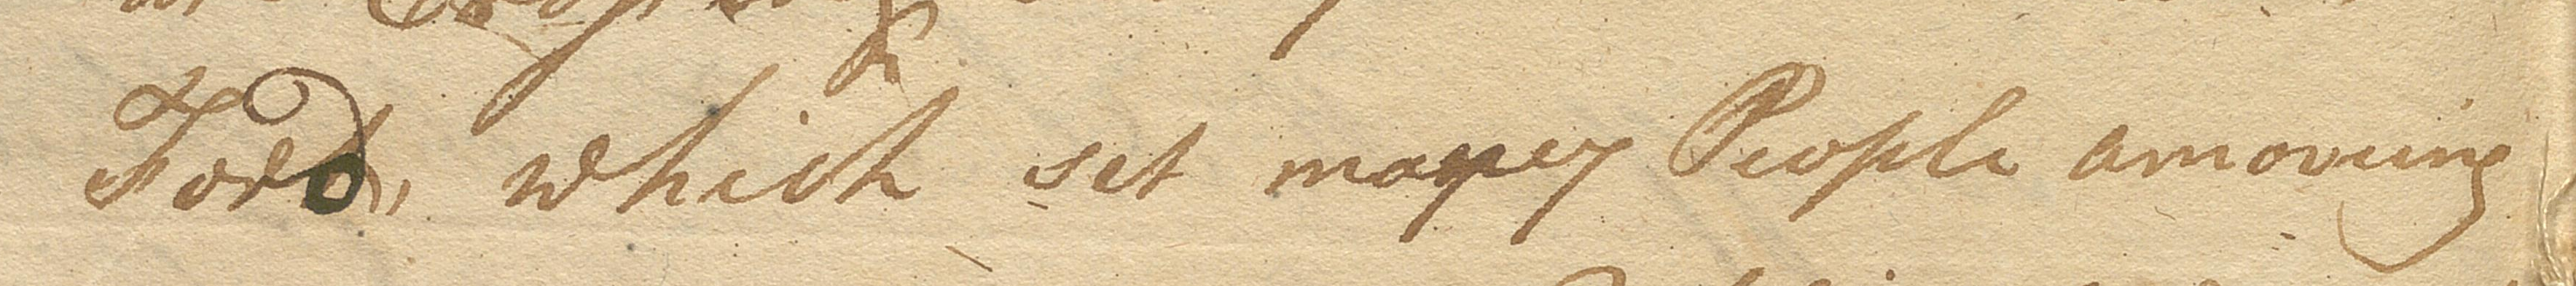Ford which set many People amoveing
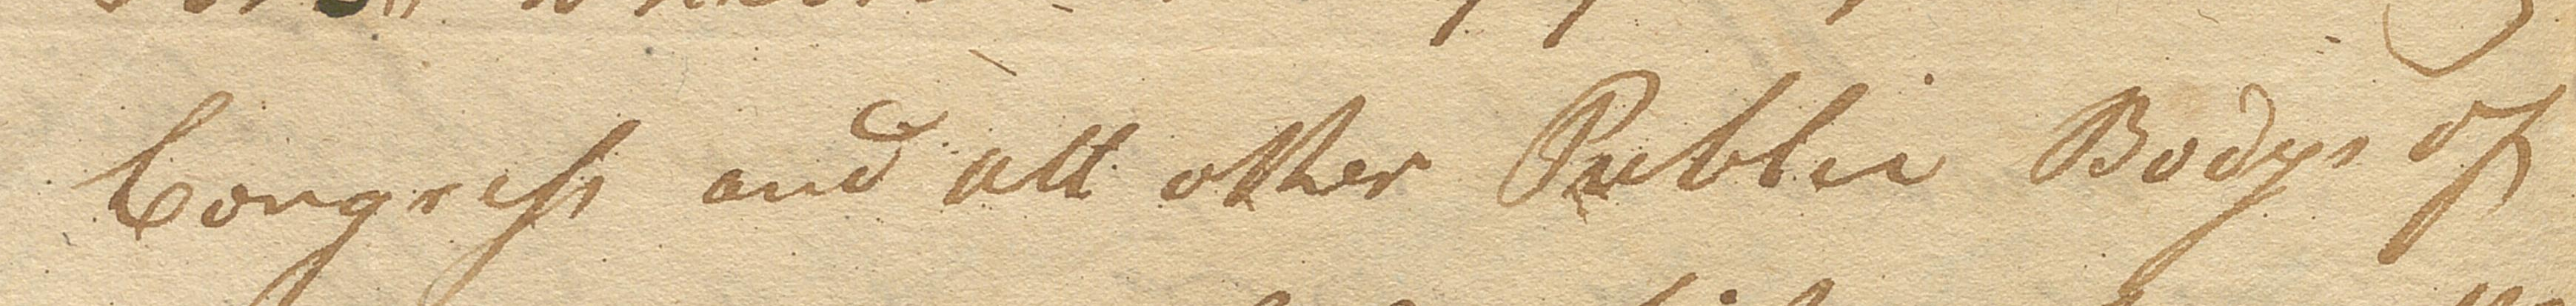Congress and all other Public Bodys of
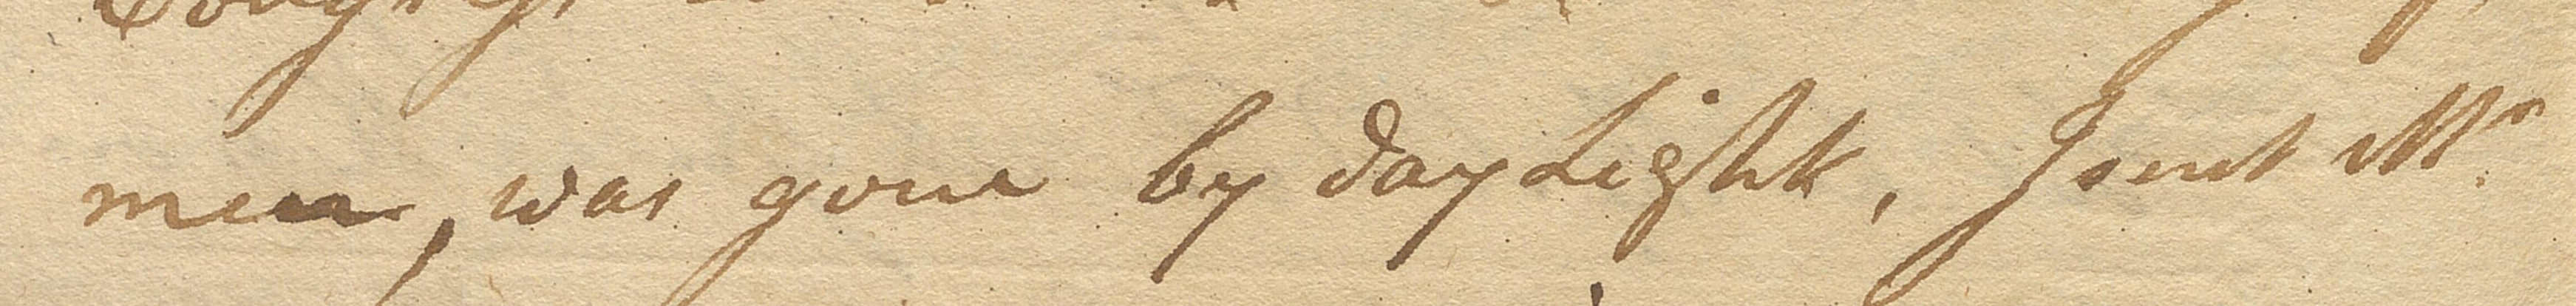men, was gone by day Light. I sent M^r.
